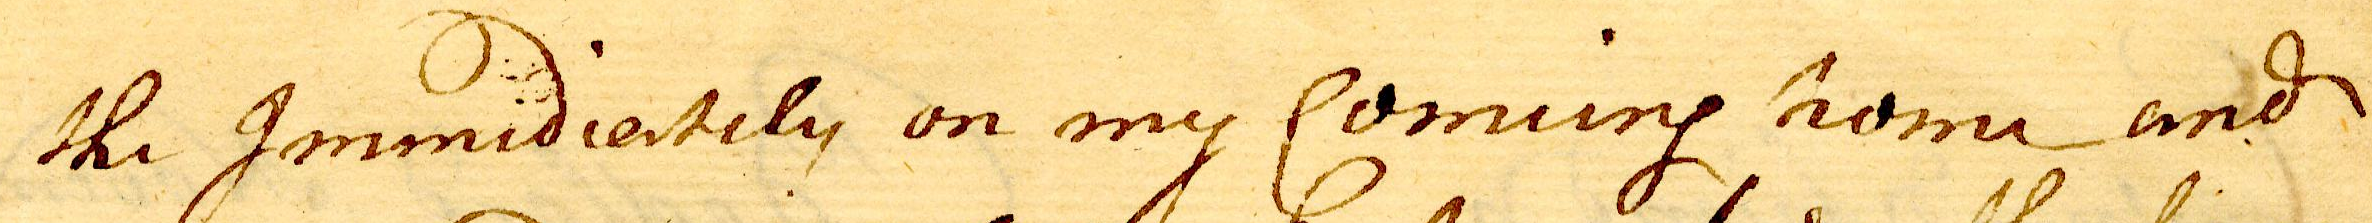the Immediately on my Coming home and
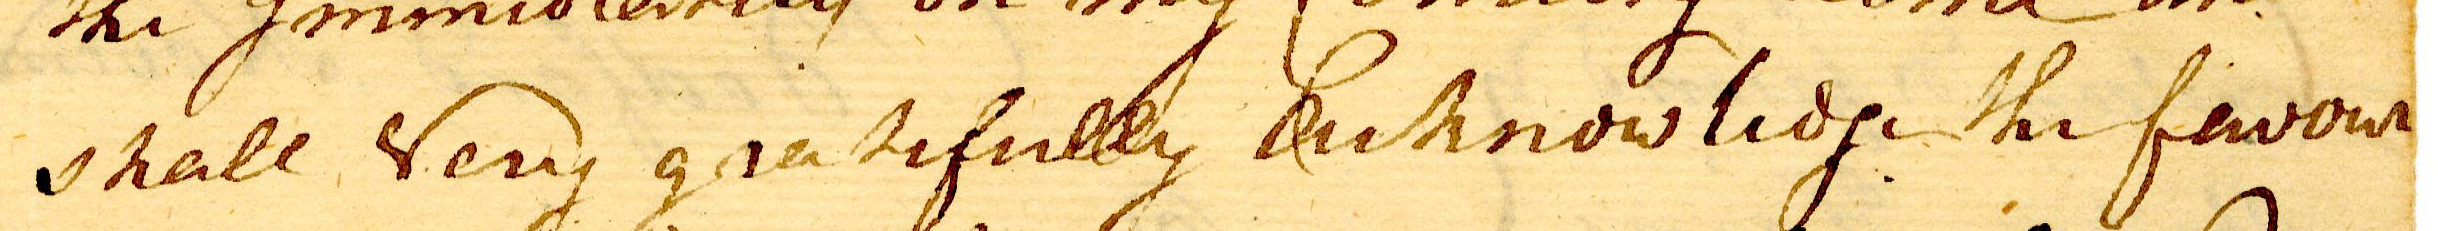shall Very gratefully Acknowledge the favour
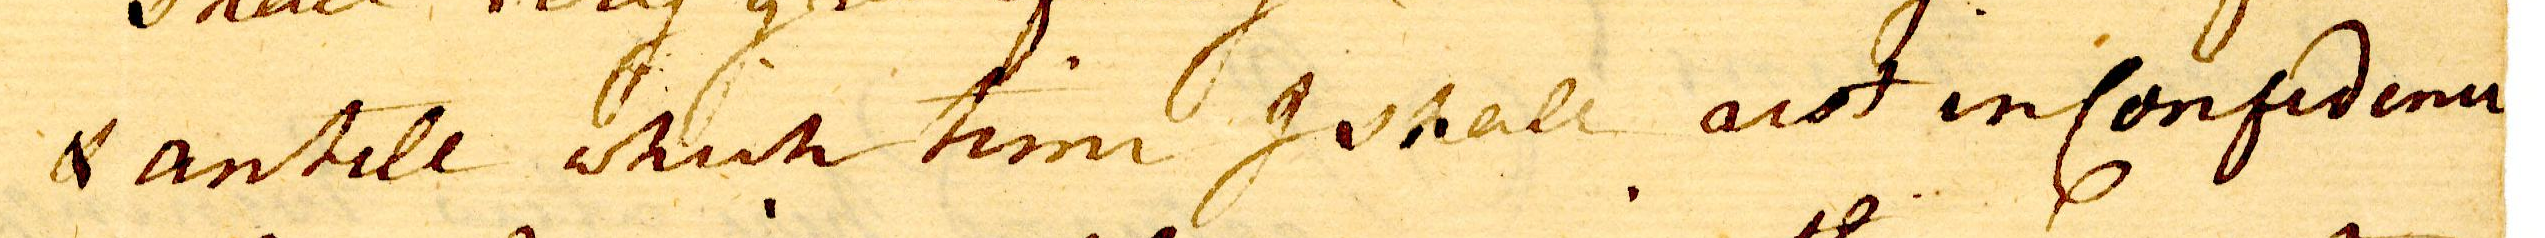& antell which him I shall rest in Confidence
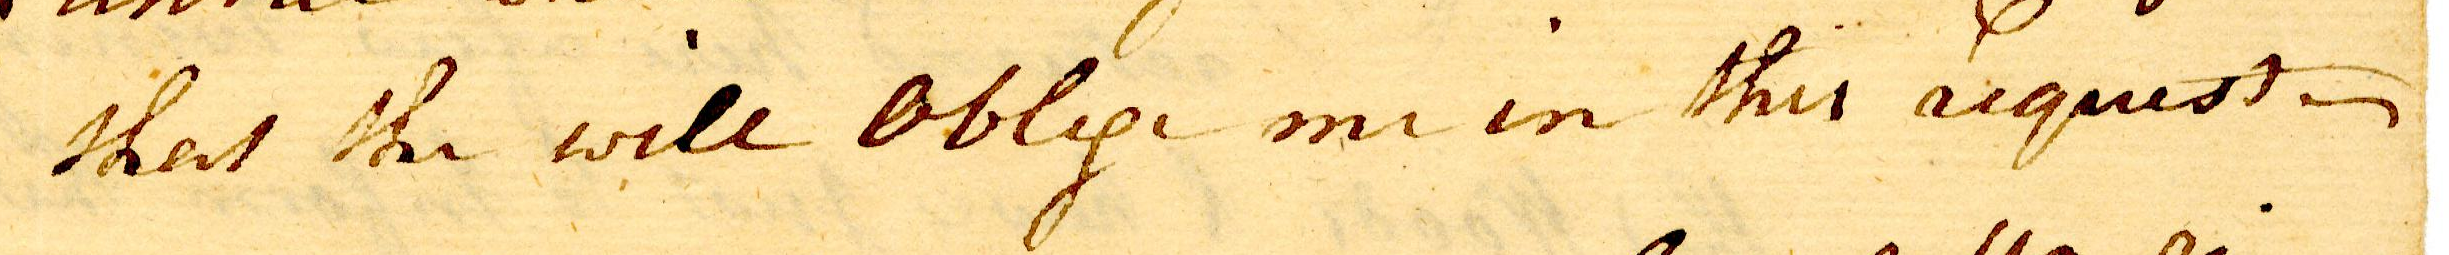that the will oblige me in this request-
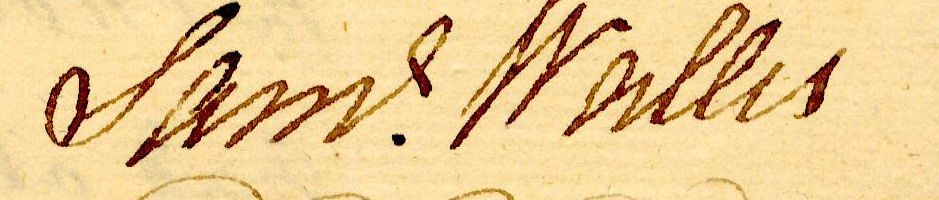Sam^l. Wallis
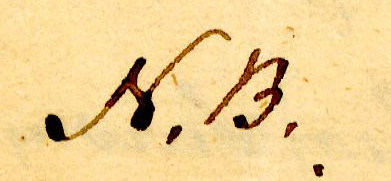N. B.
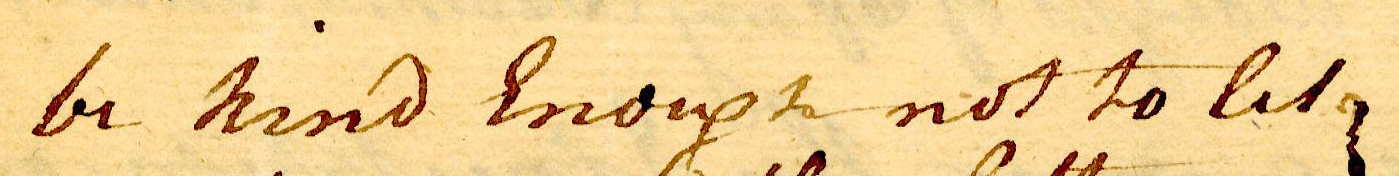be kind Enough not to let
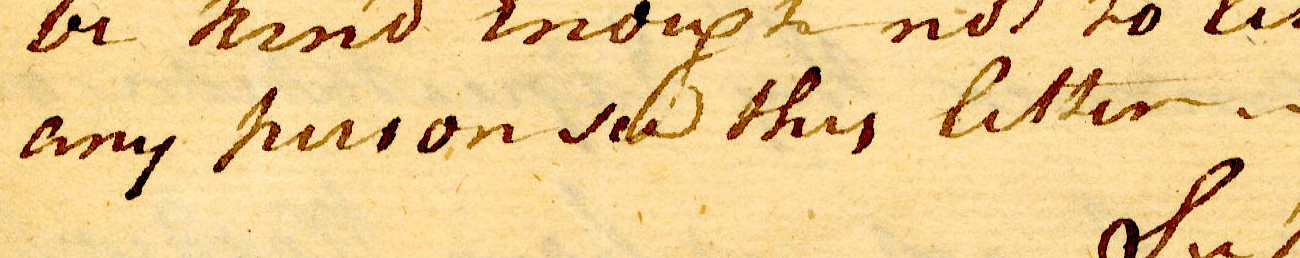any person see this letter.
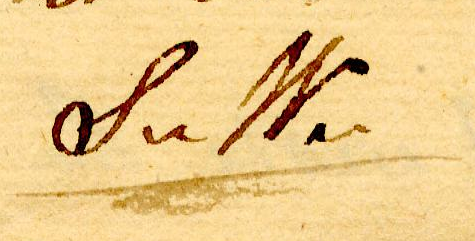S- W-
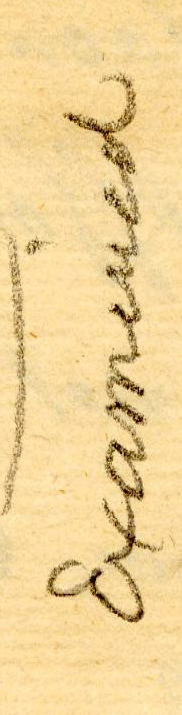Examined
